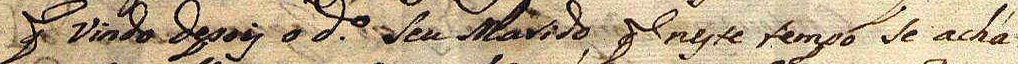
q̄ vindo depois o d.o seu Marido, q̄ neste tempo se acha
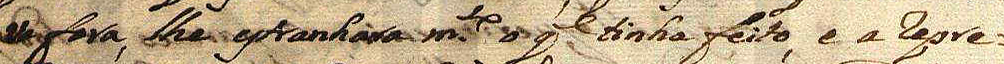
va fora, lhe estranhara m.to o q̄ tinha feito, e a Repre
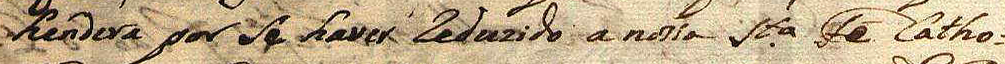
hendera por se haver Reduzido a nossa St.a Fé Catho
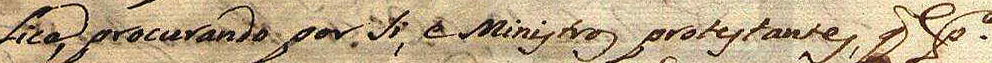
Lica, procurando por si, e Ministros protestantes, q̄ p.a
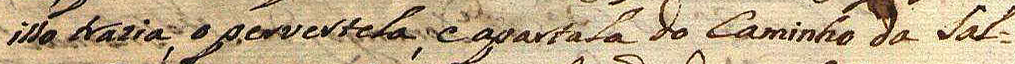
isso trazia, o pervertela, e apartala do Caminho da sal
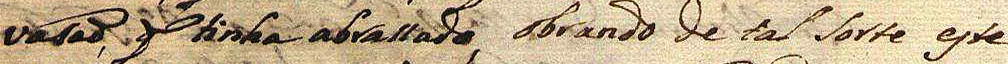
vasaõ, q̄ tinha abrassado, obrando de tal sorte este
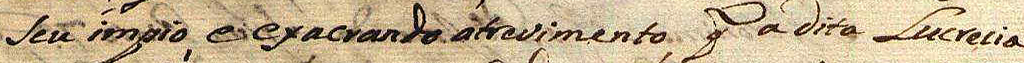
seu ímpio, e exacrando atrevimento, q̄ a dita Lucrecia
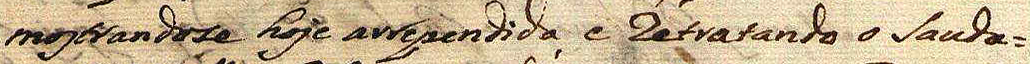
mostrandose hoje arrependida, e Retratando o sauda
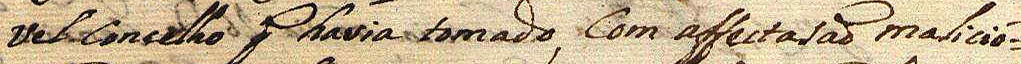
vel concelho q̄ havia tomado, Com affectasão malicio
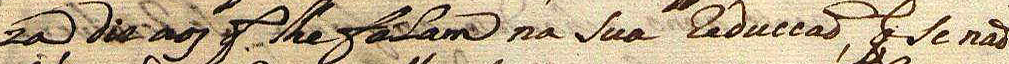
za, diz aos q̄. lhe falam na sua Reduccaõ, q̄ se não
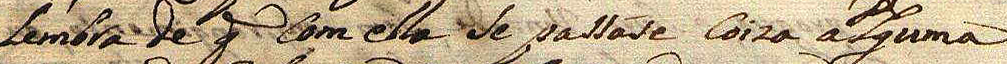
Lembra de q̄ Com ella se passáse coiza alguma
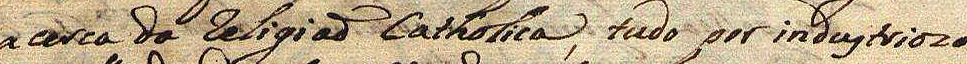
acerca da Religião Catholica, tudo por industriozo
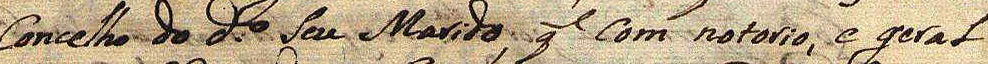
Concelho do d.o seu Marido, q̄ com notorio, e geral
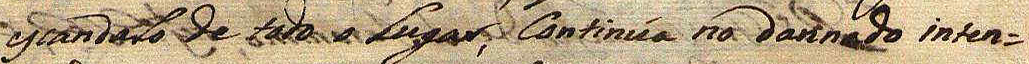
escandalo de todo o Lugar, Continúa no dannado inten
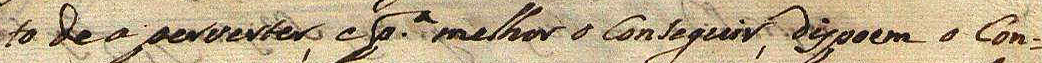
to de a perverter, e p.a melhor o Conseguir dispoem o Con
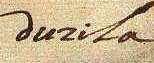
duziLa
